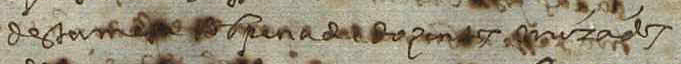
desta mesa sob pena de dozentos cruzados
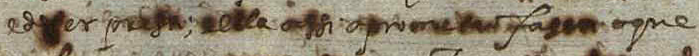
e de ser presa; e ella assi o prometeo fazer o que
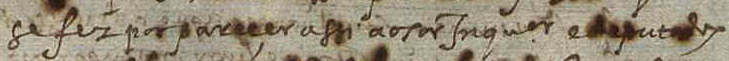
se fez por parecer assi ao sor̄ Jnqu.or e deputados
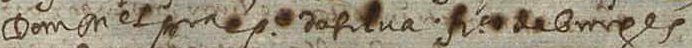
Dom Mel pra e p.o da silua. fr.co de burges
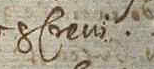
o esCreui.
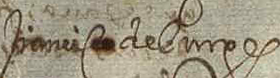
Francisco de burges
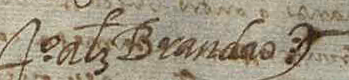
J.o al̄z Brandão
